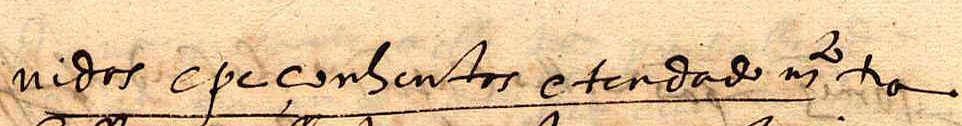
uidos e peçonhentos e ten dado mto tra
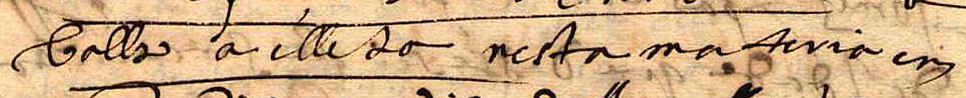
balho a elle ta nesta materia em
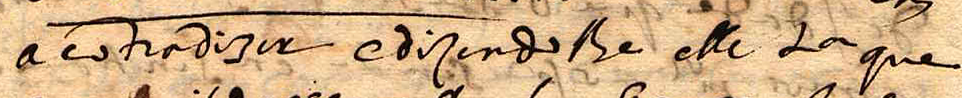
a cōtra dizer e dizendolhe elle ta que
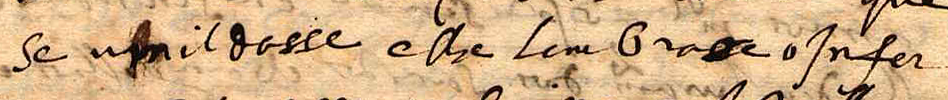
se umildasse e lhe lembrase o Jnfer
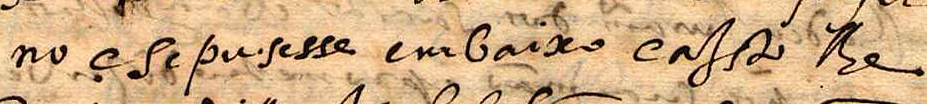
no e se pusesse em baixo e a Jsto lhe
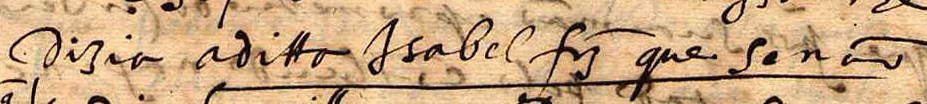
dizia a ditta Jsabel frz̄ que se não
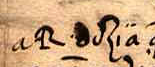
a R. dizia q̄
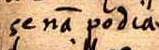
se nā podia
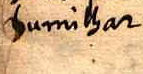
humilhar
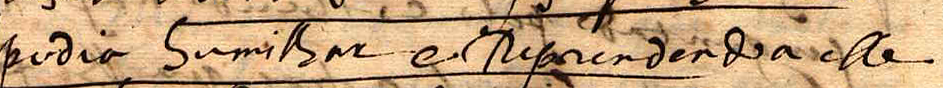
podia humilhar e Reprendendo a elle
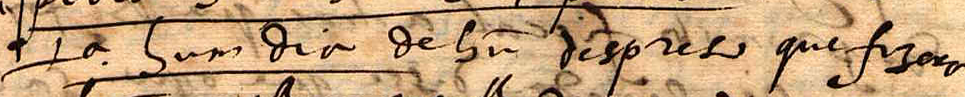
ta. hum dia de hū despreso que fizera
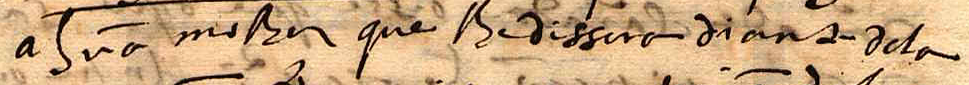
a hūa molher que lhe dissera diante dela
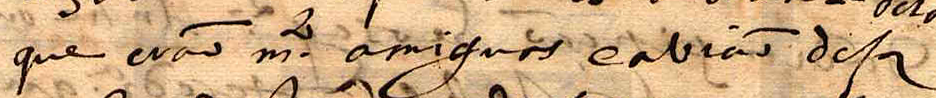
que erão mto amiguas e aviaõ de Jr
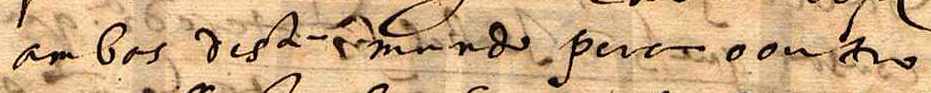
ambas deste mundo pera o outro
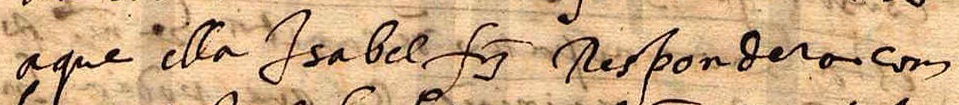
a que ella Jsabel frz̄ Respondera com
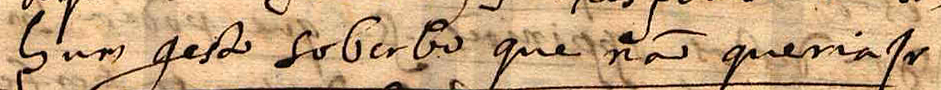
hum gesto soberbo que não queria Jr
